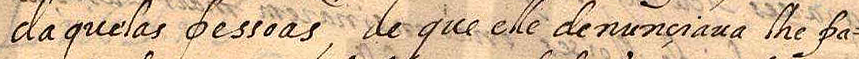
daquelas pessoas, de que elle denunçiaua lhe pa
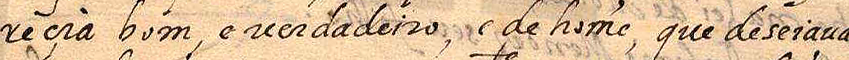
reçia bom, e uerdadeiro, e de homē, que deseiaua
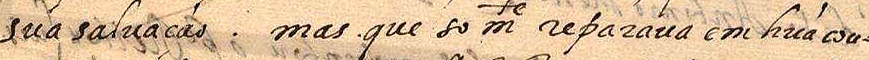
sua saluação. mas que somte reparaua em huā cou
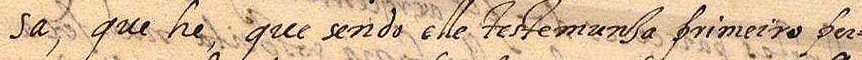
sa, que he, que sendo elle testemunha primeiro per
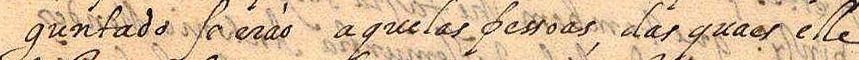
guntado se eraõ aquelas pessoas, das quaes elle
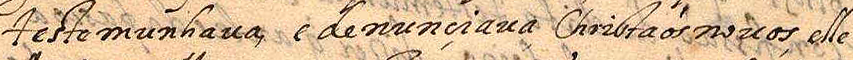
testemunhaua, e denunçiaua, Christaõs nouos, elle
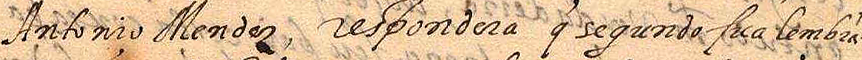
Antonio Mendez, respondera q̄ segundo sua lembrā
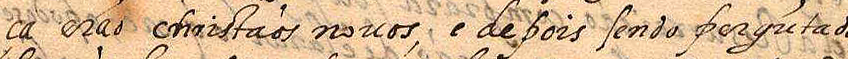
ça erão christaõs nouos, e depois sendo pergūtado,
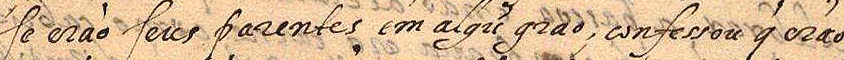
se eraõ seus parentes em algū grao, confessou q̄ erão
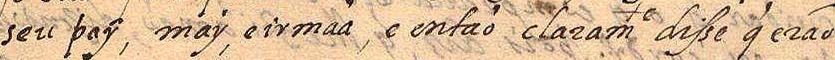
seu pay, may, e irmaā, e entaõ claramte disse q̄ erão
